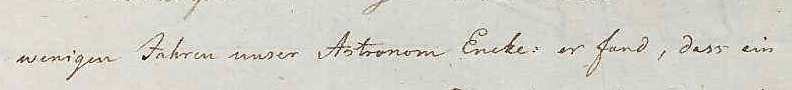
wenigen Jahren unser Astronom Encke: er fand, dass ein
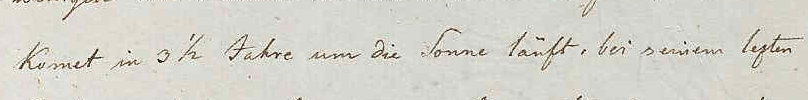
Komet in 3½ um die Sonne läuft, bei seinem lezten
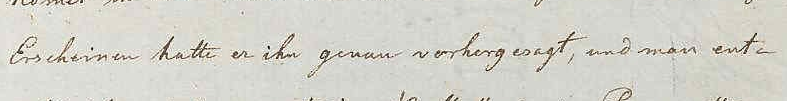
Erscheinen hatte er ihn genau vorhergesagt, und man ent-
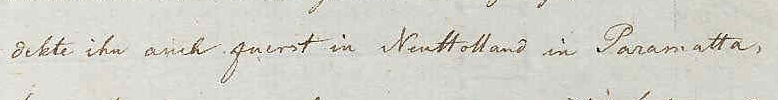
dekte ihn auch zuerst in NeuHolland in Paramatta,
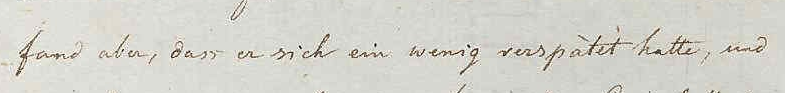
fand aber, dass er sich ein wenig verspätet hatte, und
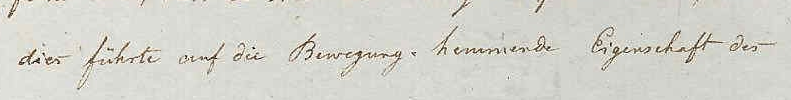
dies führte auf die Bewegung-hemmende Eigenschaft des
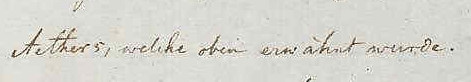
Aethers, welche oben erwähnt wurde.
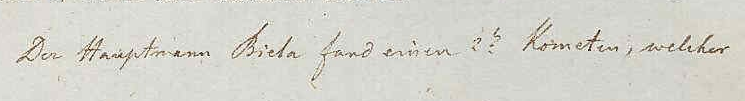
Der Hauptmann Biela fand einen 2￼ Kometen, welcher
